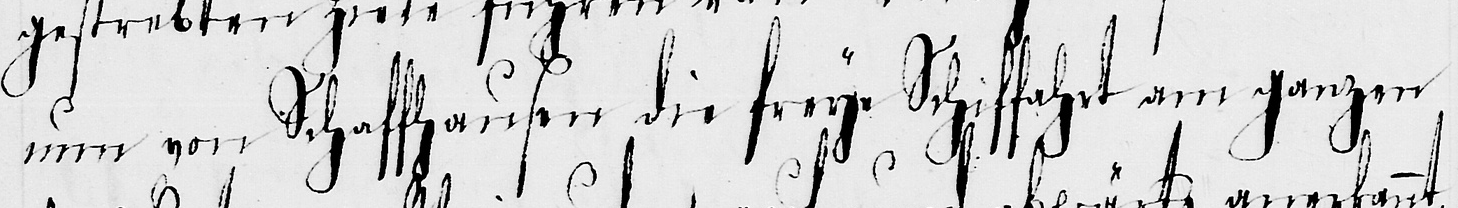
nun von Schaffhausen die freye Schiffahrt am ganzen
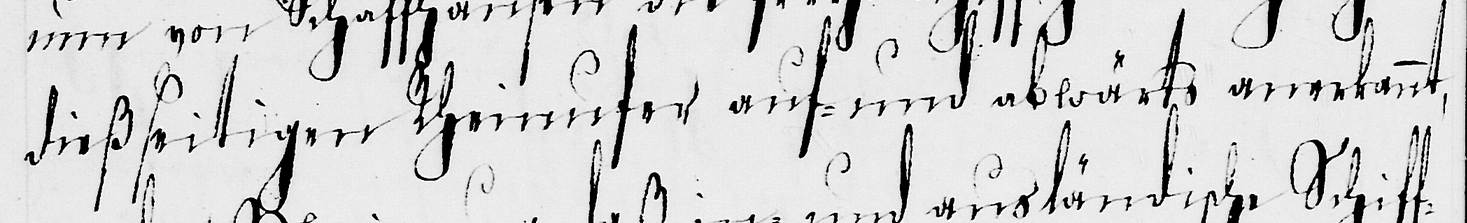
dießseitigen Rheinufer auf- und abwärts anerkann¬
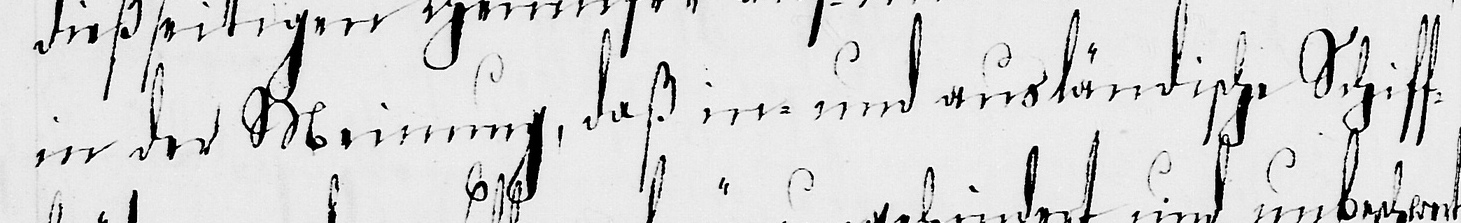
in der Meinung, daß in- und ausländische Schif¬
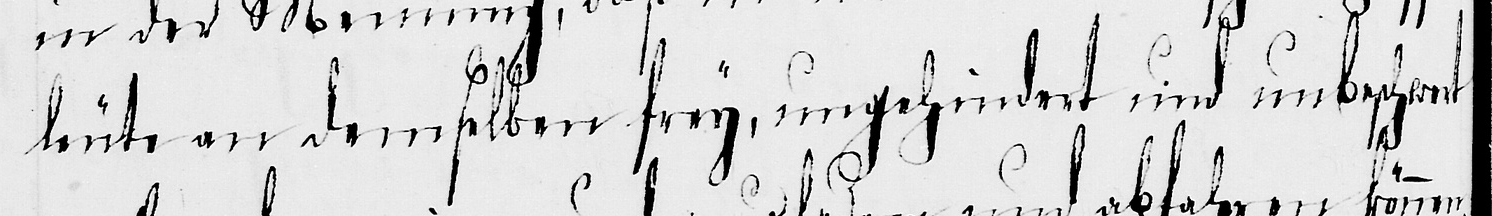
fleute an demselben frey, ungehindert und unbeschwert
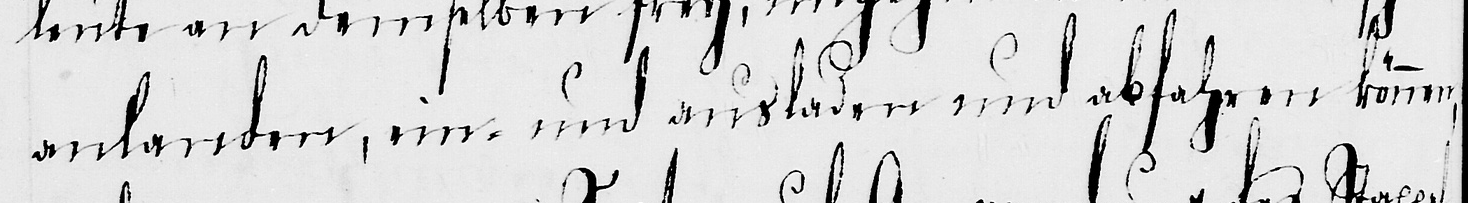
anlanden, ein- und ausladen und abfahren könn¬
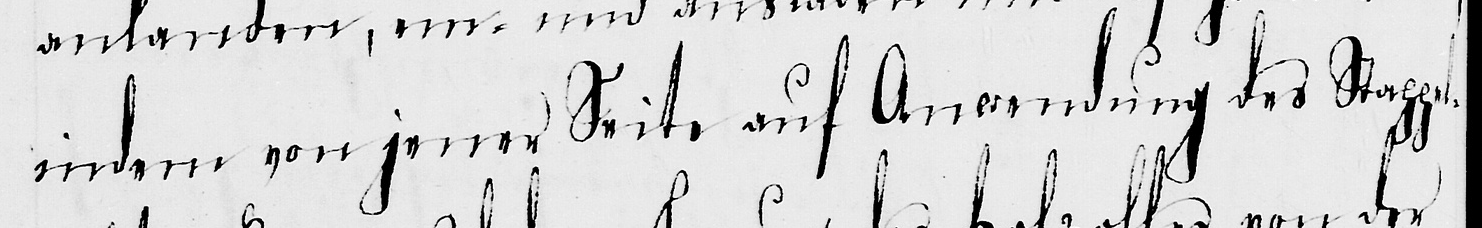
indem von jener Seite auf Anwendung des Stapp¬
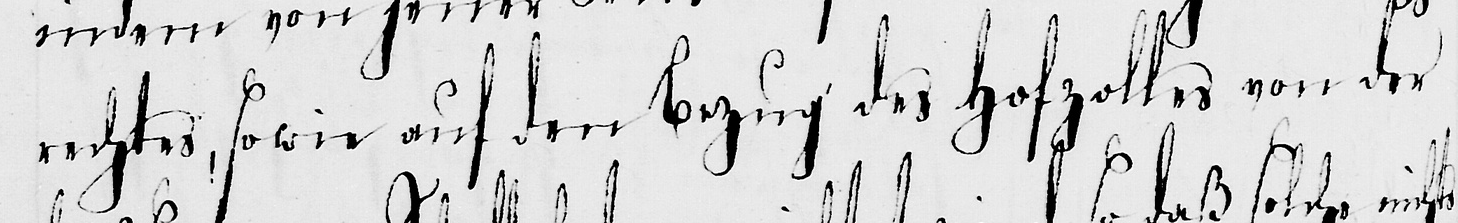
rechtes, sowie auf den Bezug des Hofzolles von der
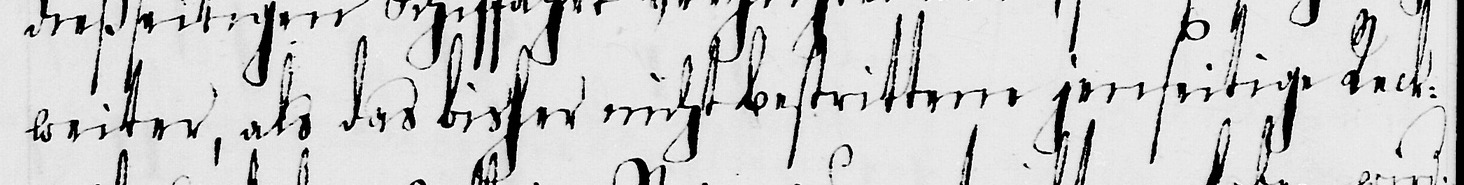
weiter, als das bisher nicht bestrittene jenseitige Reck¬
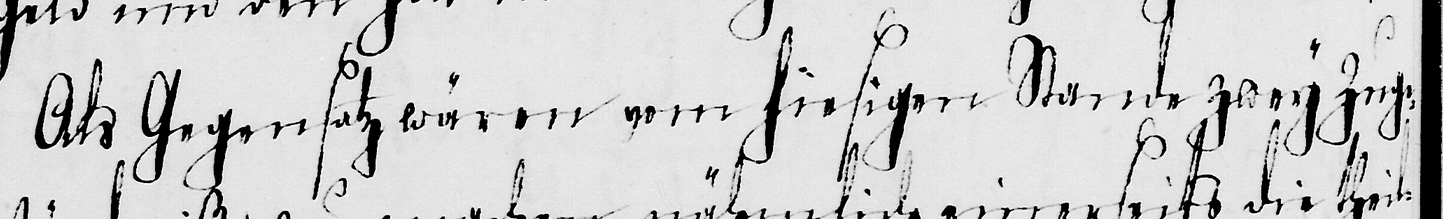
Als Gegensatz wären vom hiesigen Stande zwey Zuge¬
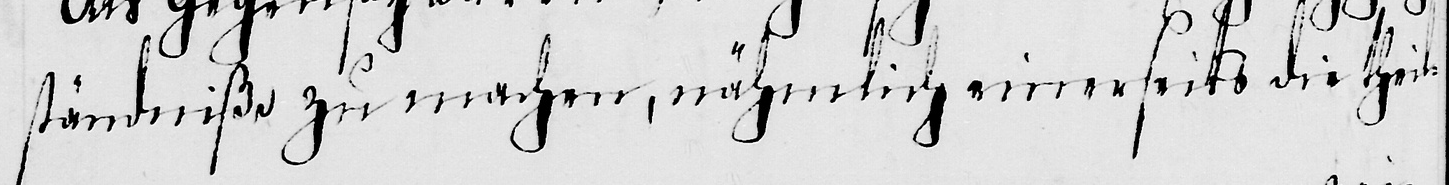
ständniße zu machen, nähmlich einerseits die thei¬
